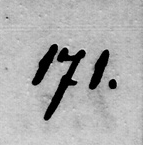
16.
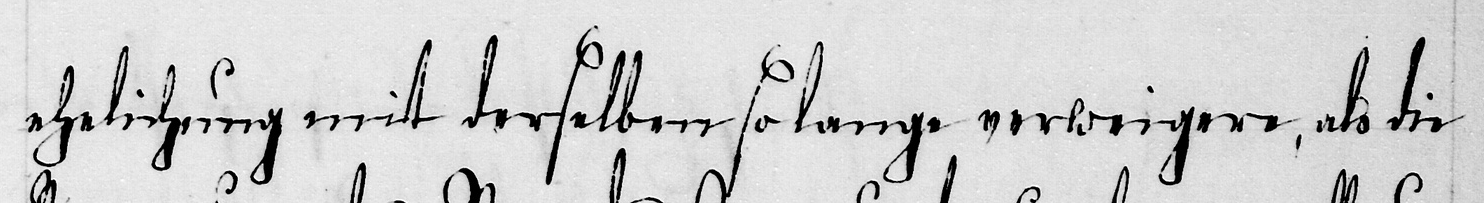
ehelichung mit derselben so lange verweigere, als die
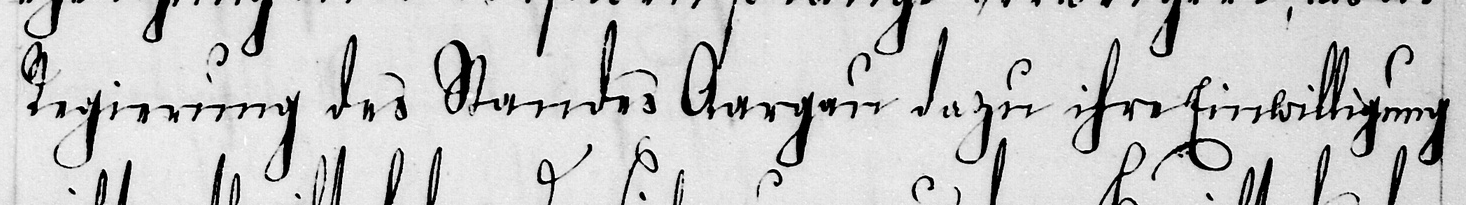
Regierung des Standes Aargau dazu ihre Einwilligung
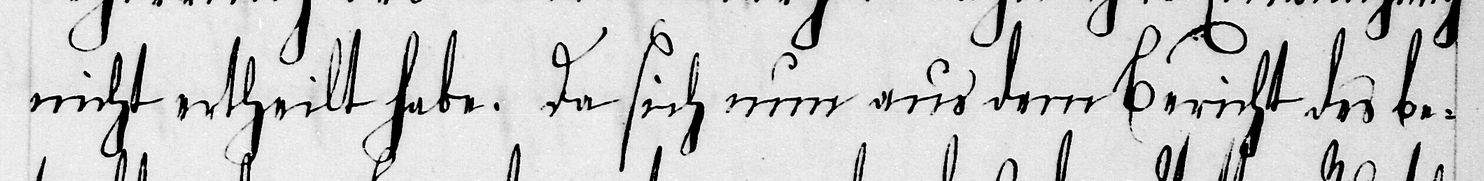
nicht ertheilt habe. Da sich nun aus dem Bericht des be¬
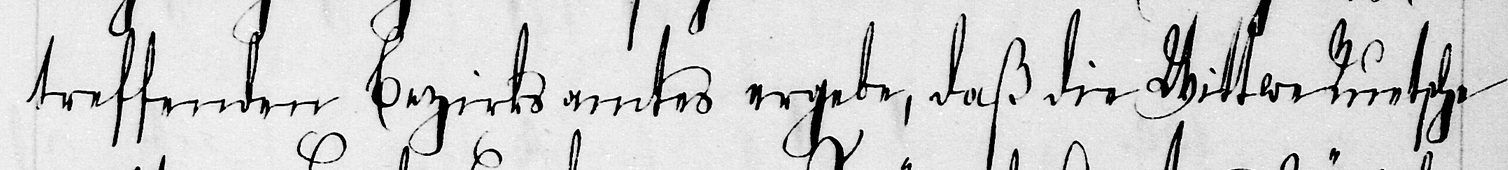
treffenden Bezirksamtes ergebe, daß die Wittwe Ruetsche
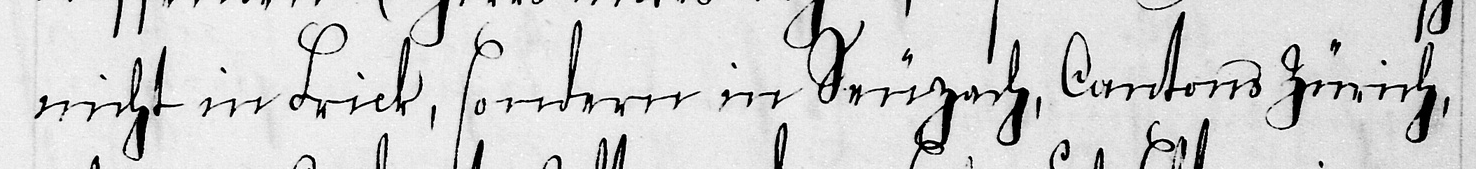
nicht in Frick, sondern in Seuzach, Cantons Zürich,
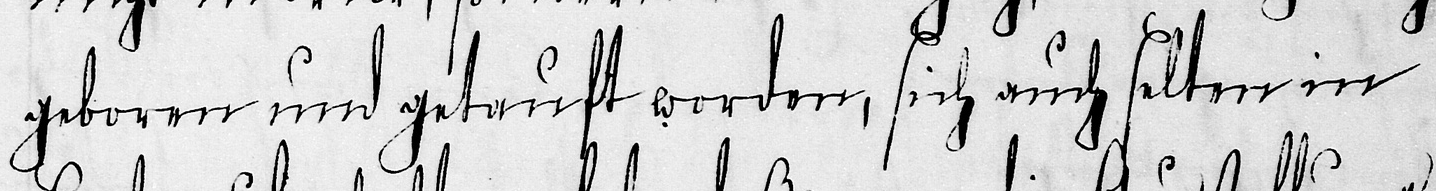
geboren und getauft worden, sich auch selten in
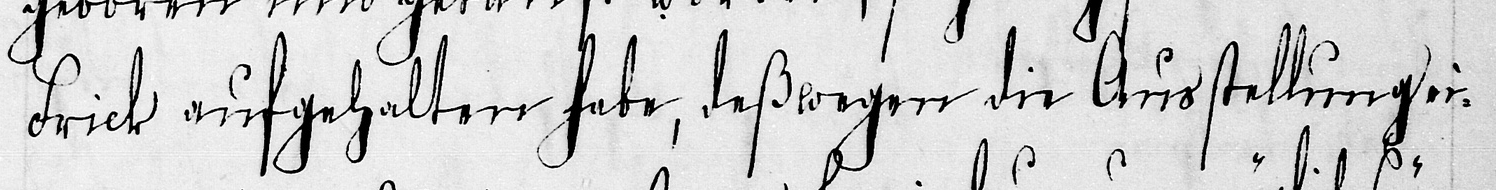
Frick aufgehalten habe, deßwegen die Ausstellung ei¬
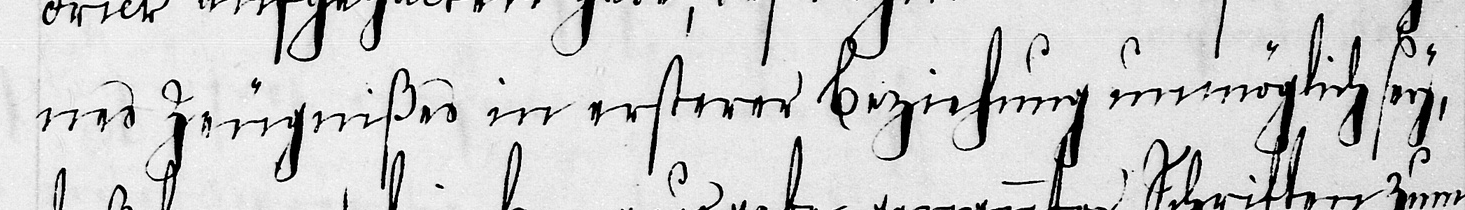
nes Zeugnißes in ersterer Beziehung unmöglich sey,
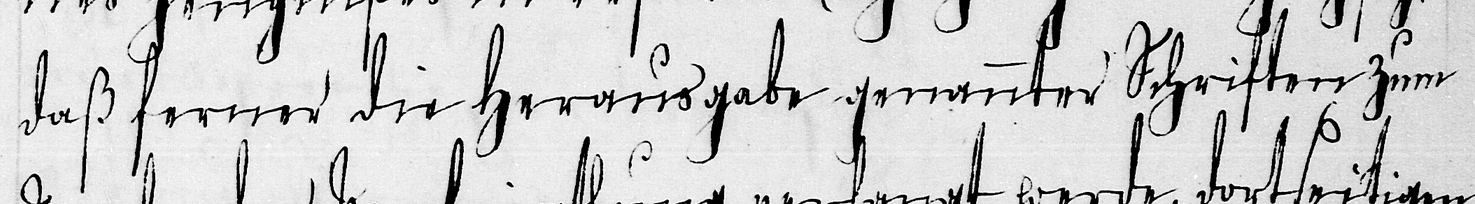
daß ferner die Herausgabe genannter Schriften zum
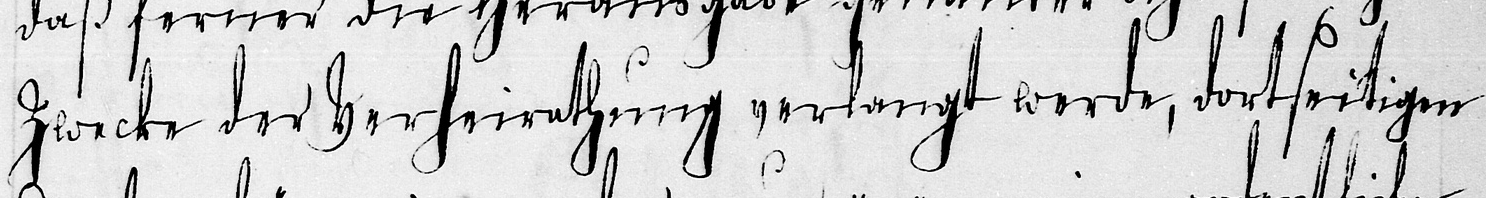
Zwecke der Verheirathung verlangt werde, dortseitigen
